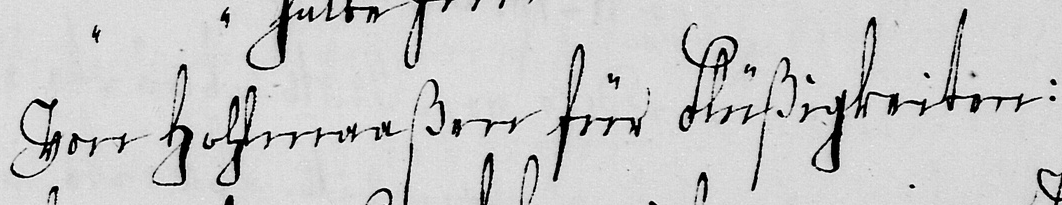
Von Holzmaaßen für Flüßigkeiten:
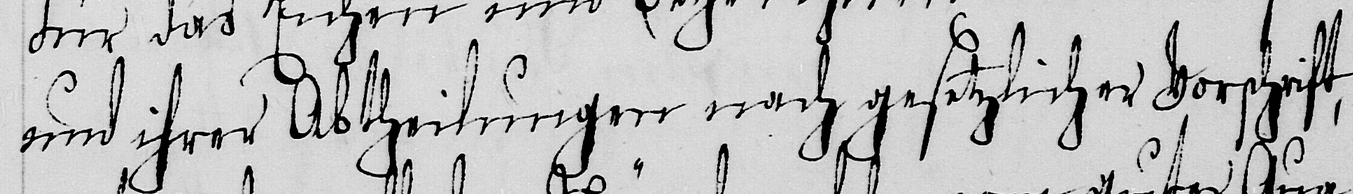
und ihrer Abtheilungen nach gesetzlicher Vorschri¬
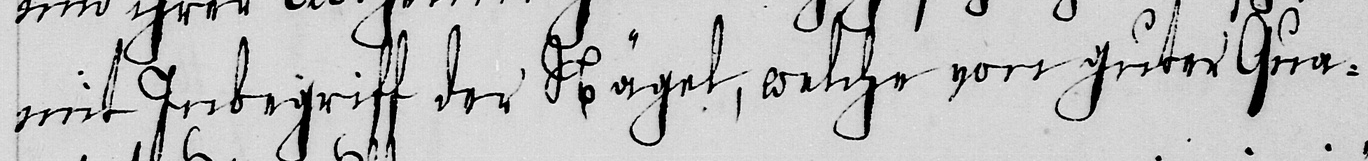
mit Inbegriff der Nägel, welche von guter Qua¬
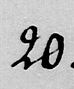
20.
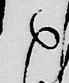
ft,
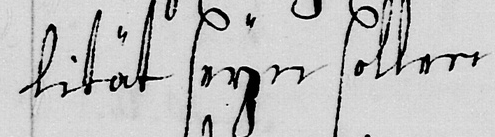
lität seyn sollen
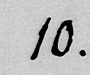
10.
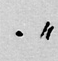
4.
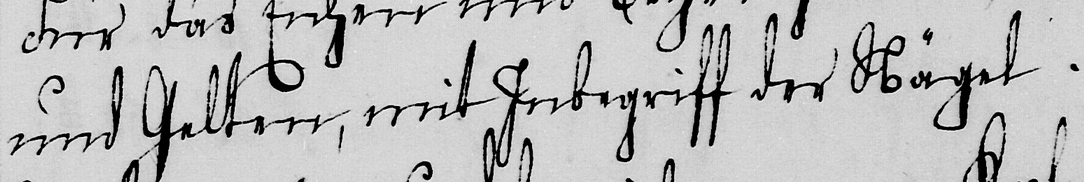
und Gelten, mit Inbegriff der Nägel
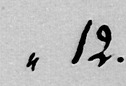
12.
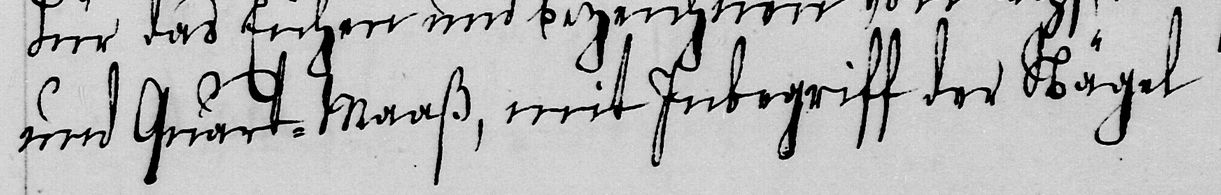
und Quart-Maaß, mit Inbegriff der Nägel
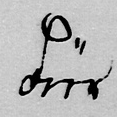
Für
